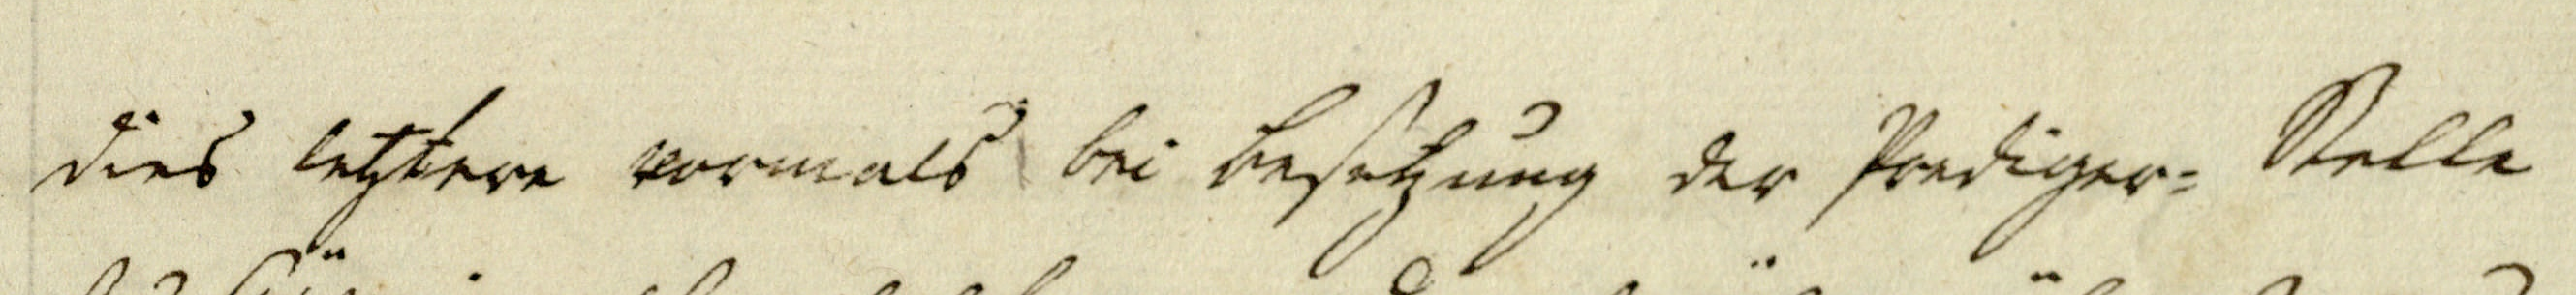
dies letztere vormals bei Besetzung der Prediger- Stelle
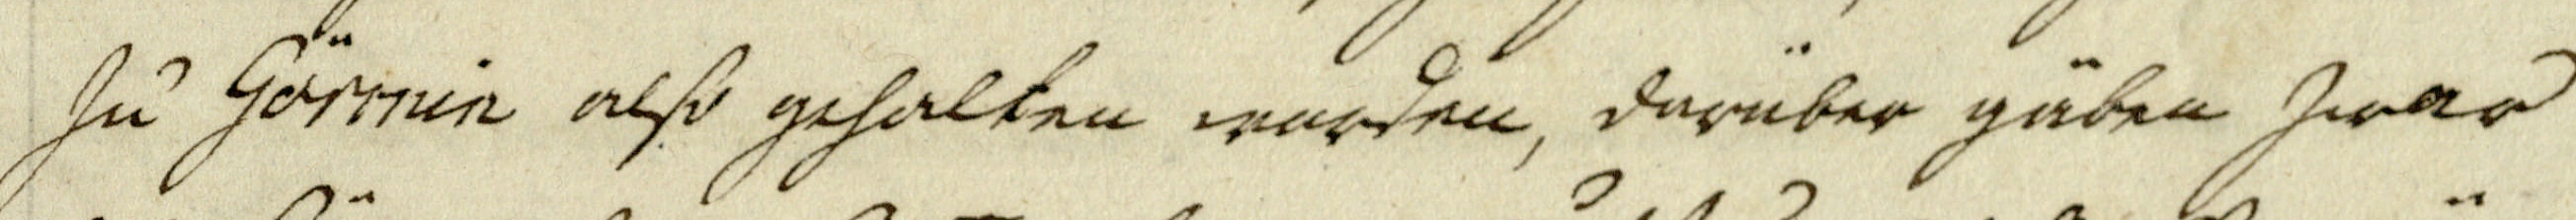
zu Görmin also gehalten worden, darüber gäben zwar
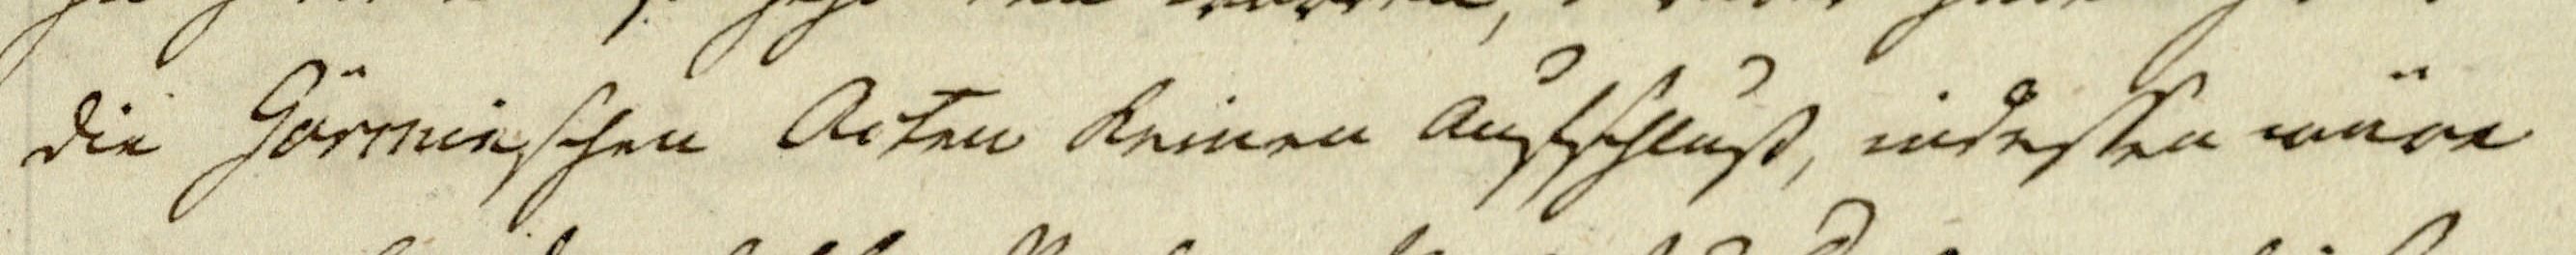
die Görminschen Acten keinen Aufschluß, indessen wäre
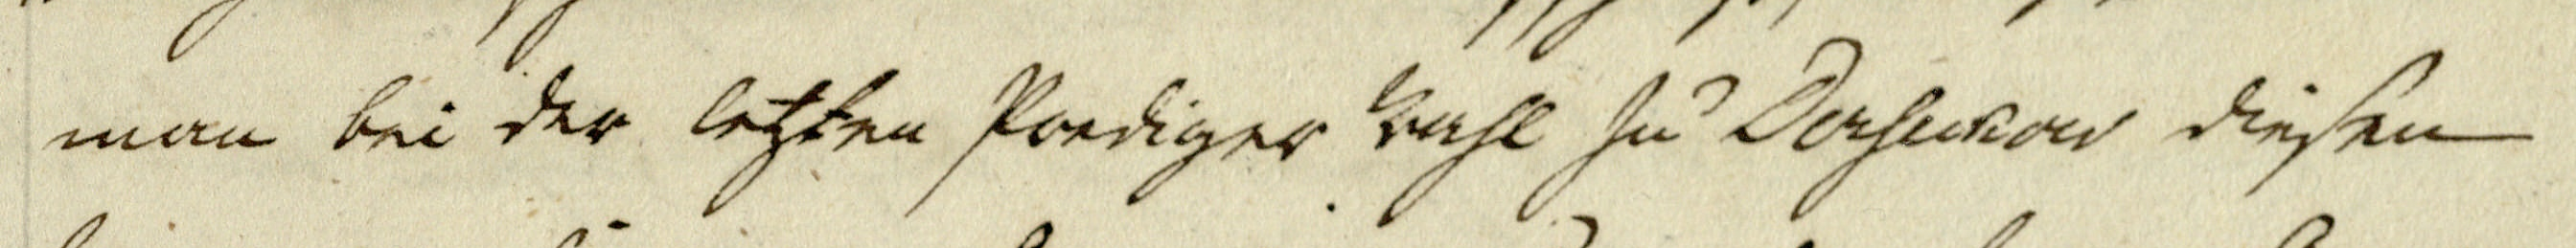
man bei der letzten Prediger Wahl zu Derseckow diesen
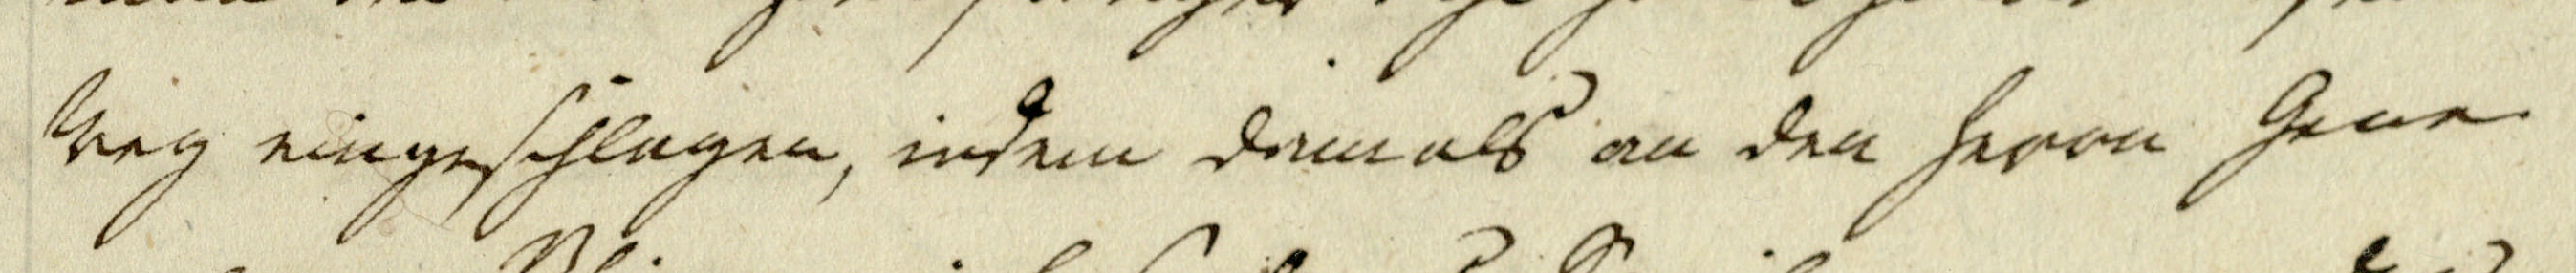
Weg eingeschlagen, indem damals an den Herrn Gene¬
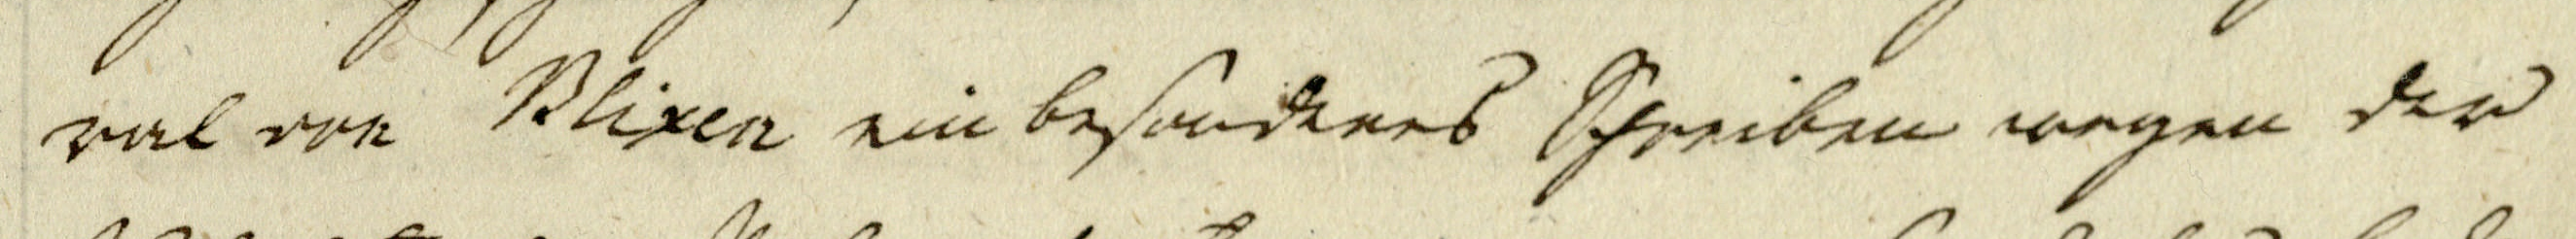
ral von Blixen ein besonderes Schreiben wegen der
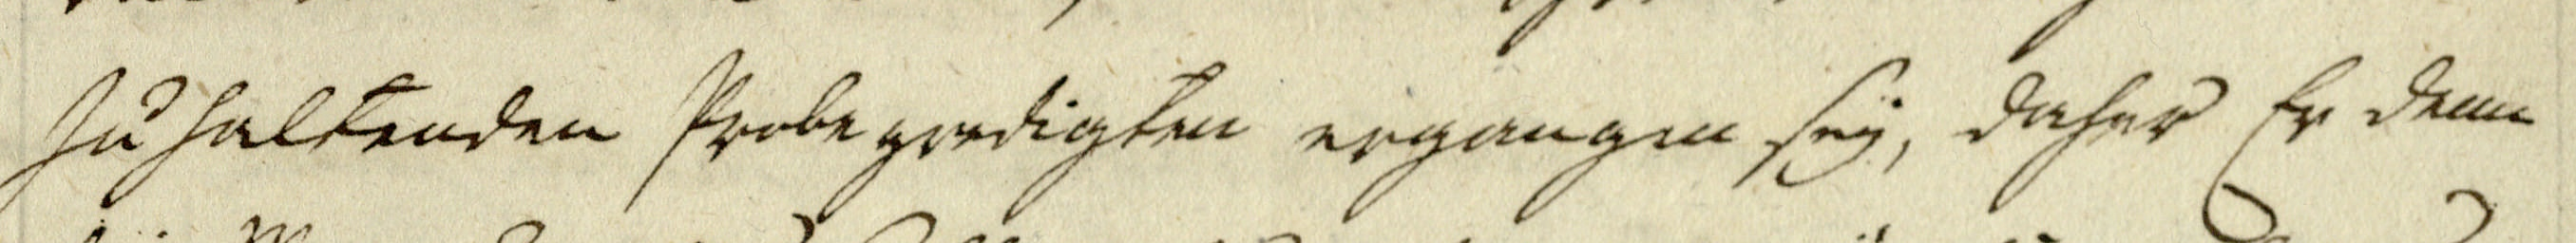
zu haltenden Probepredigten ergangen seÿ, daher Er denn
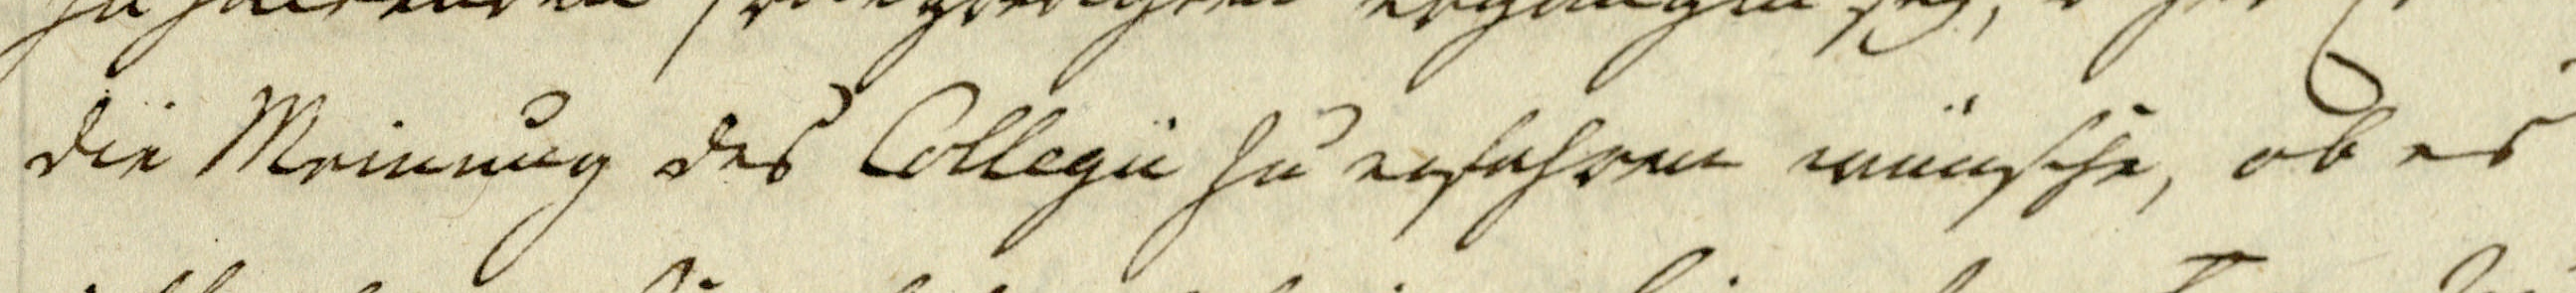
die Meinung des Collegii zu erfahren wünsche, ob es
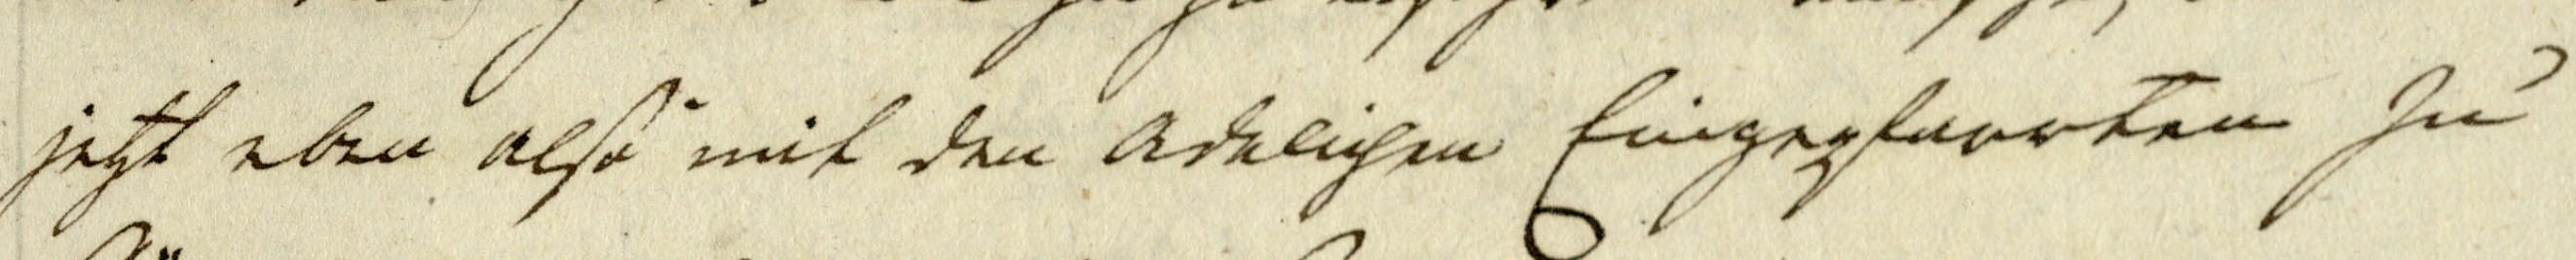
jetzt eben also mit den Adelichen Eingepfarrten zu
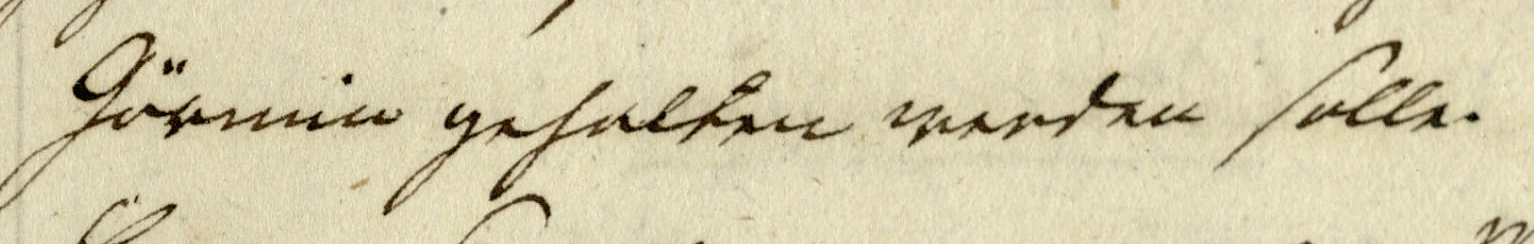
Görmin gehalten werden solle.
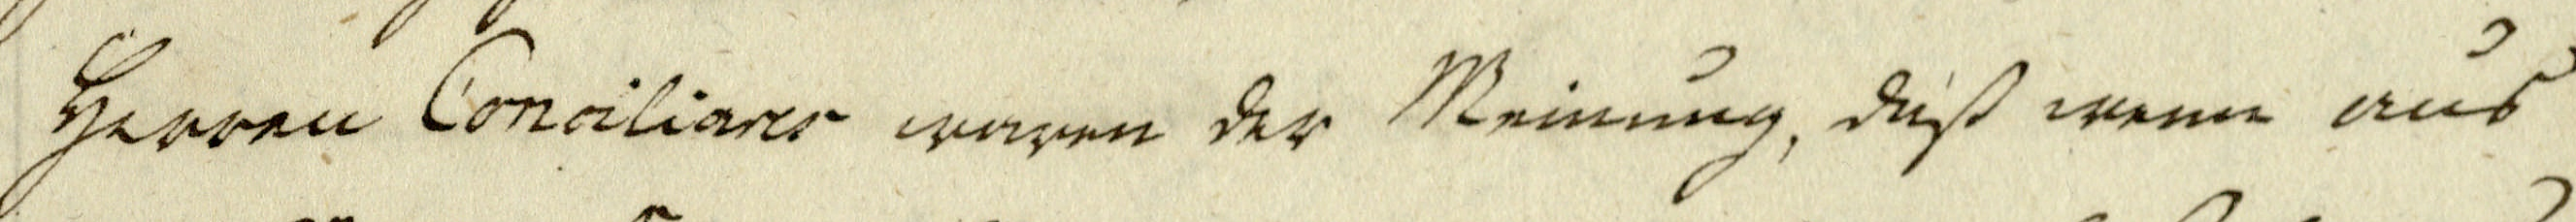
Herren Conciliares wären der Meinung, daß wenn aus
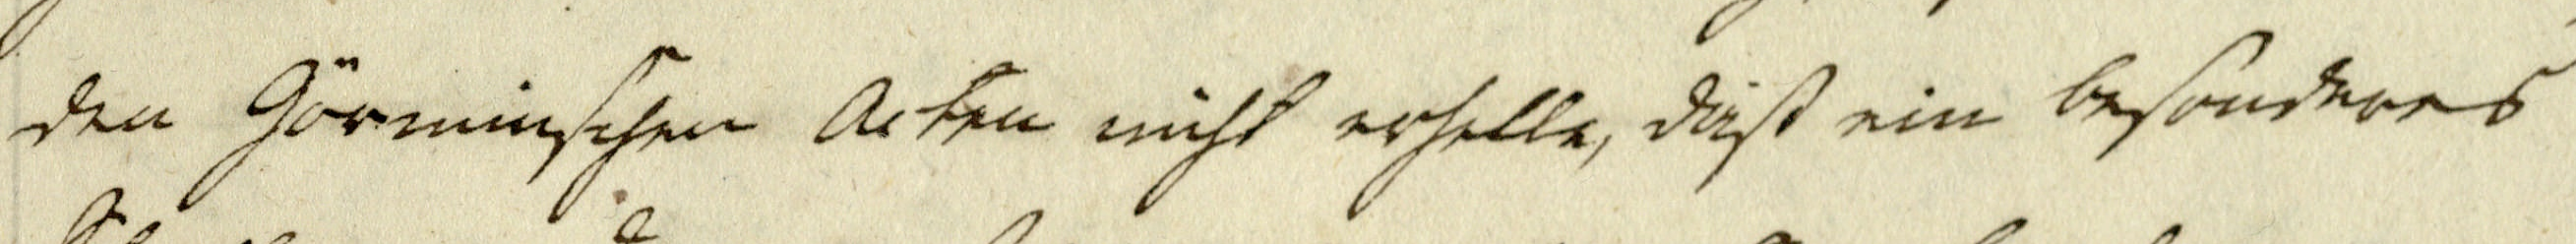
den Görminschen Acten nicht erhelle, daß ein besonderes
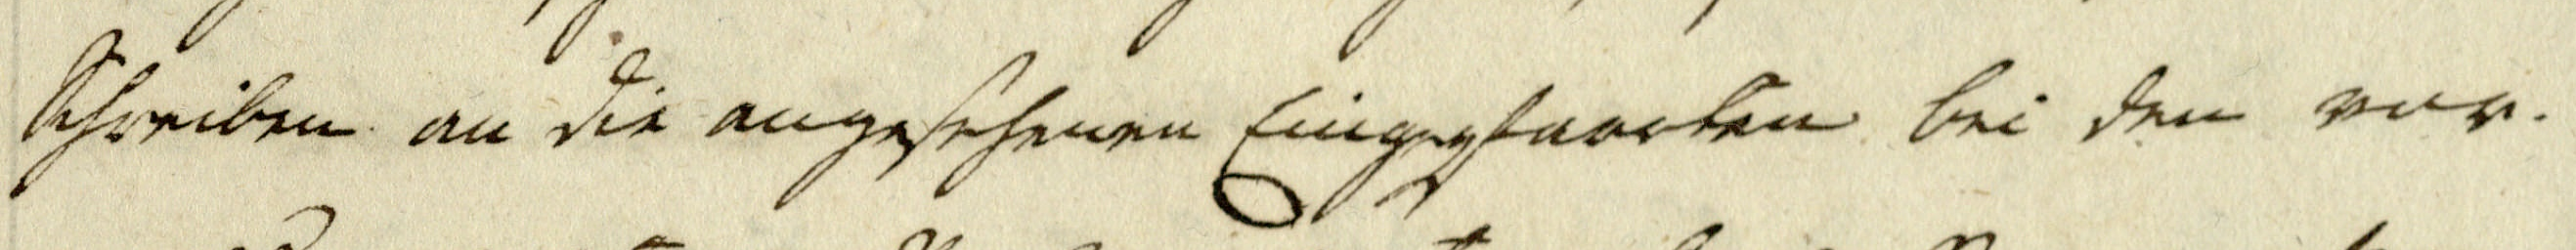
Schreiben an die angesehenen Eingepfarrten bei dem vor¬
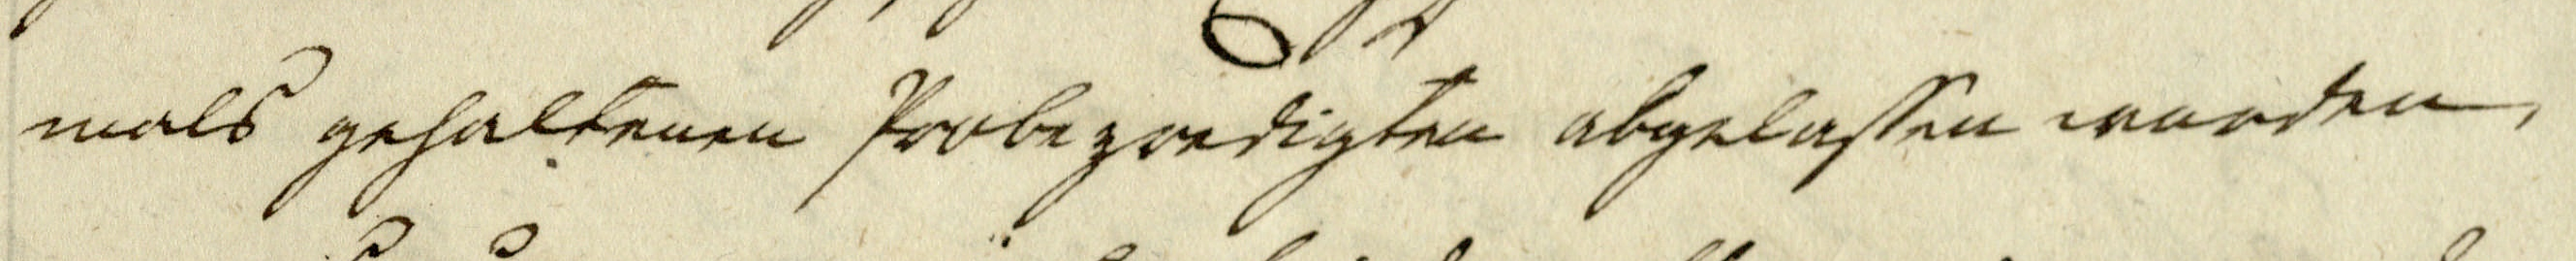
mals gehaltenen Probepredigten abgelassen worden,
